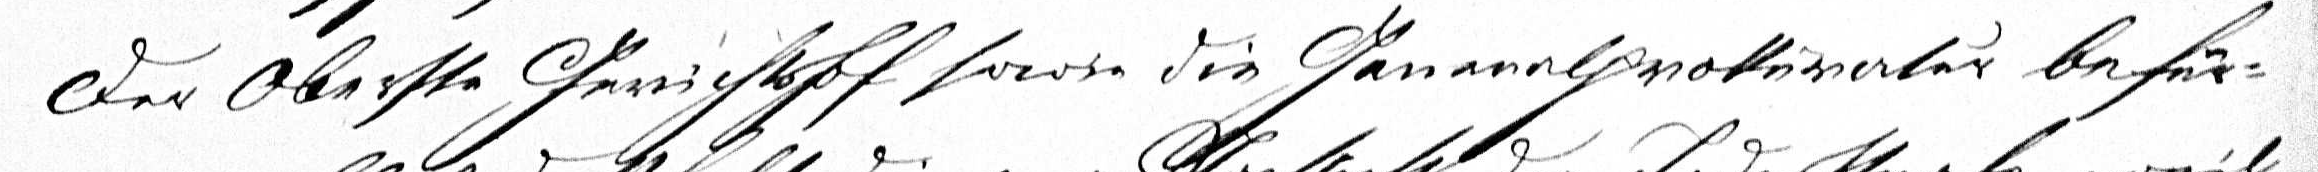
Der Oberste Gerichtshof sowie die Generalprokuratur befür¬
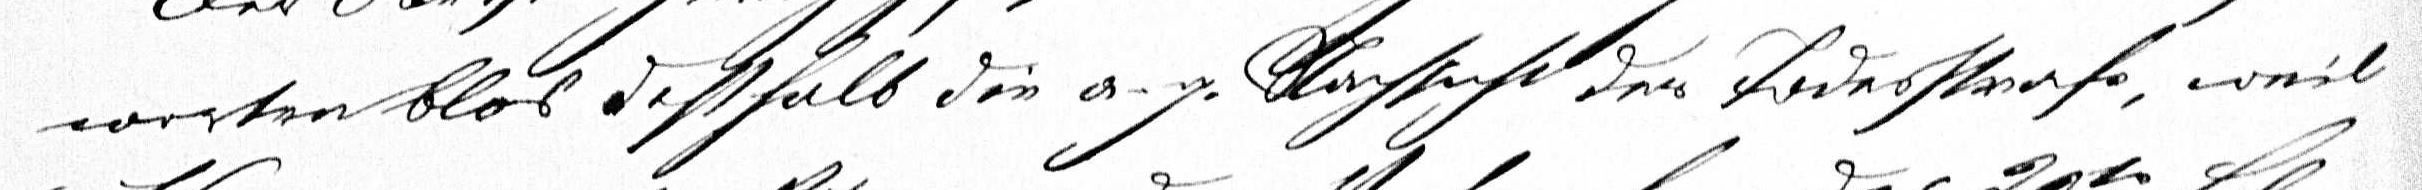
worten blos deßhalb die a.g. Nachsicht des Todesstrafe, weil
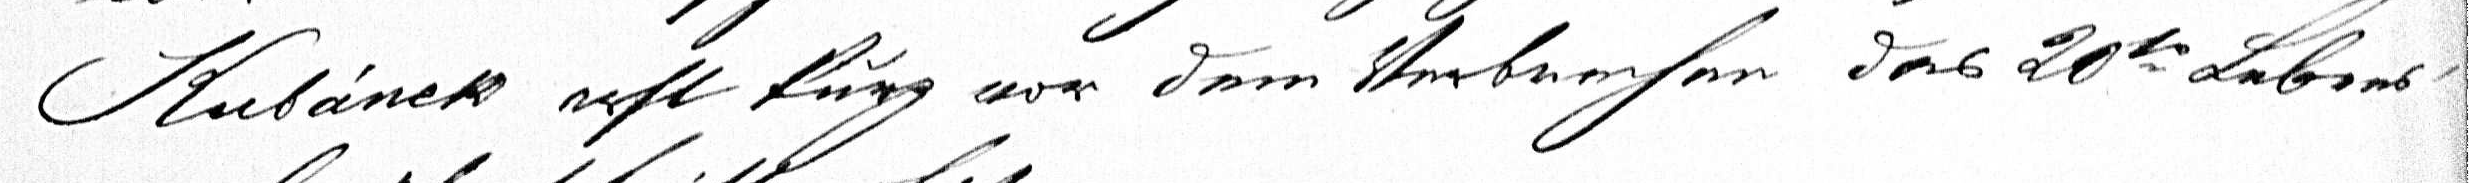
Kubánek erst kurz vor dem Verbrechen das 20te Lebens¬
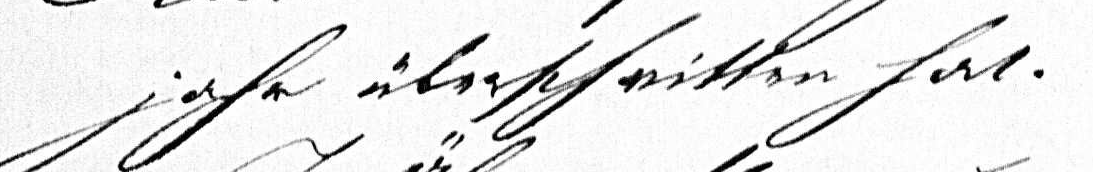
jahr überschritten hat.
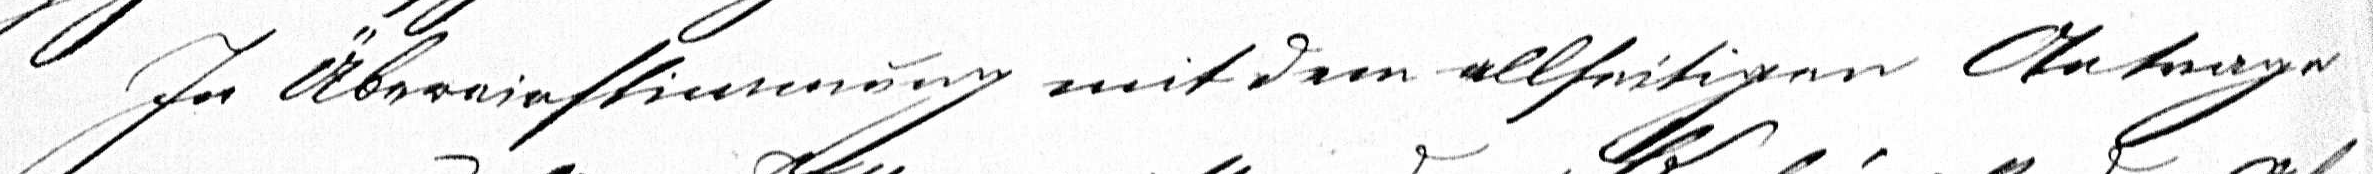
In Übereinstimmung mit dem allseitigen Antrage
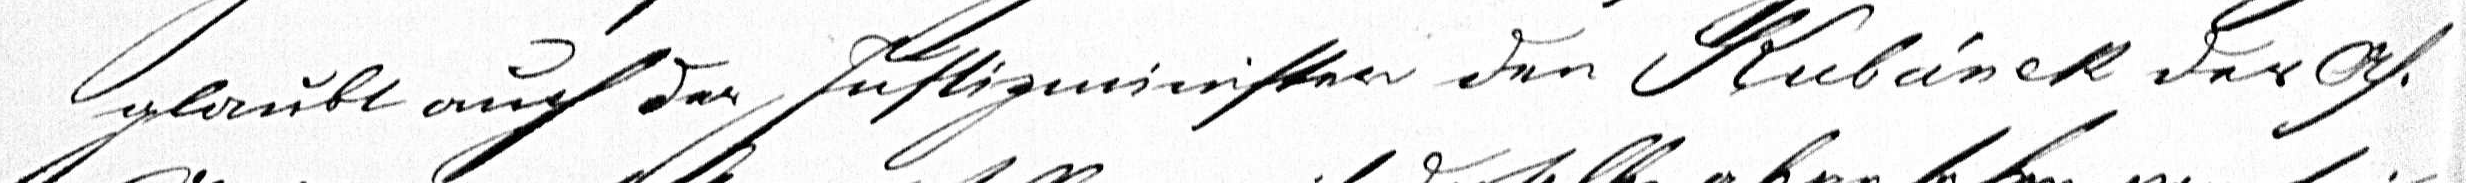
glaubt auch der Justizminister den Kubánek der Ah.
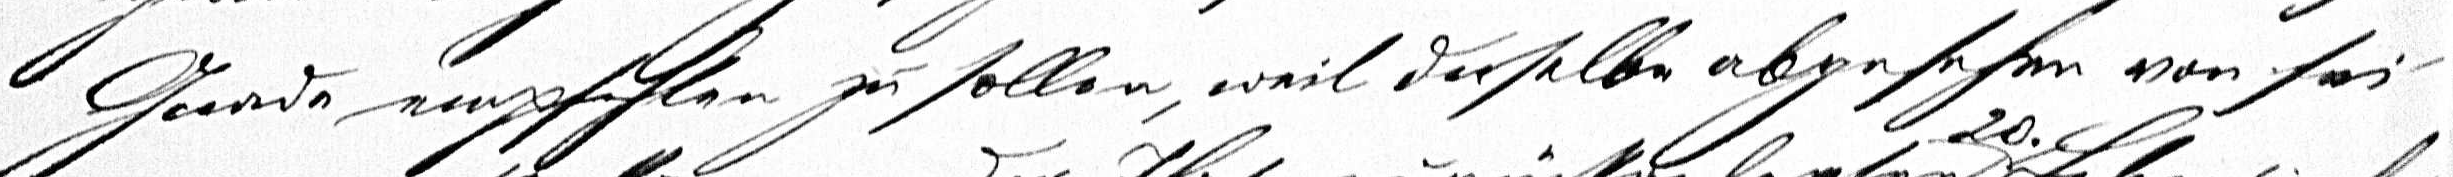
Gnade empfehlen zu sollen, weil derselbe abgesehen von sei¬
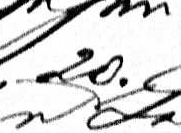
20.
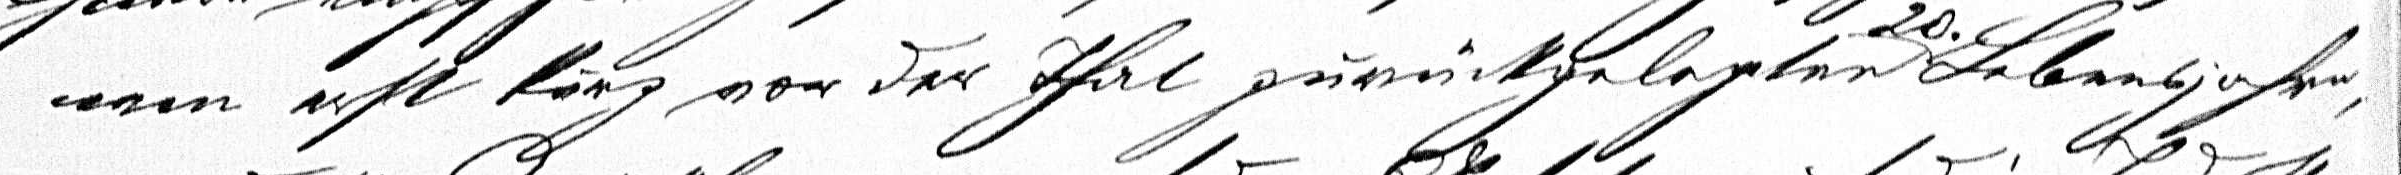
nem erst kurz vor der That zurückgelegten Lebensjahr,
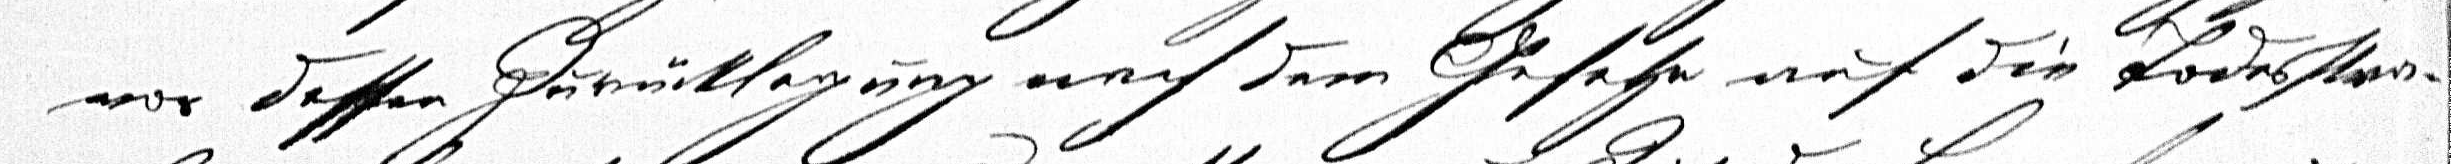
vor dessen Zurücklegung nach dem Gesetze auf die Todesstra¬
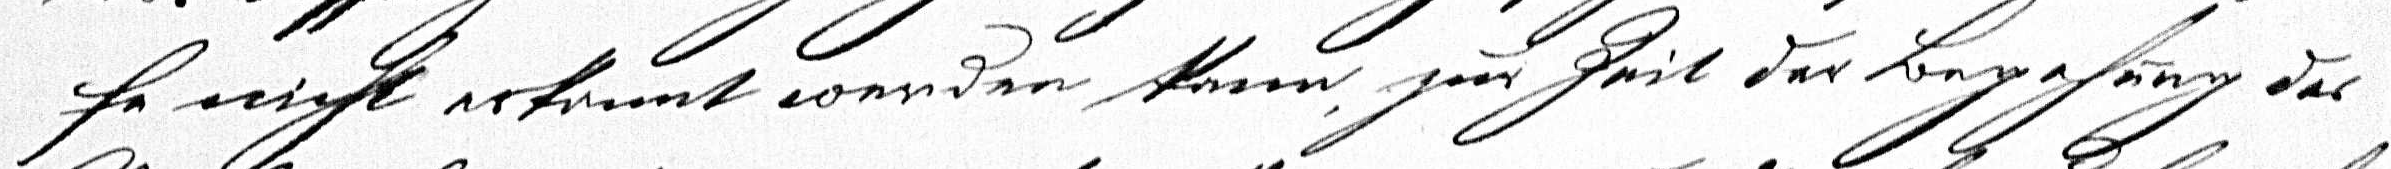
fe nicht erkannt werden kann, zur Zeit der Begehung des
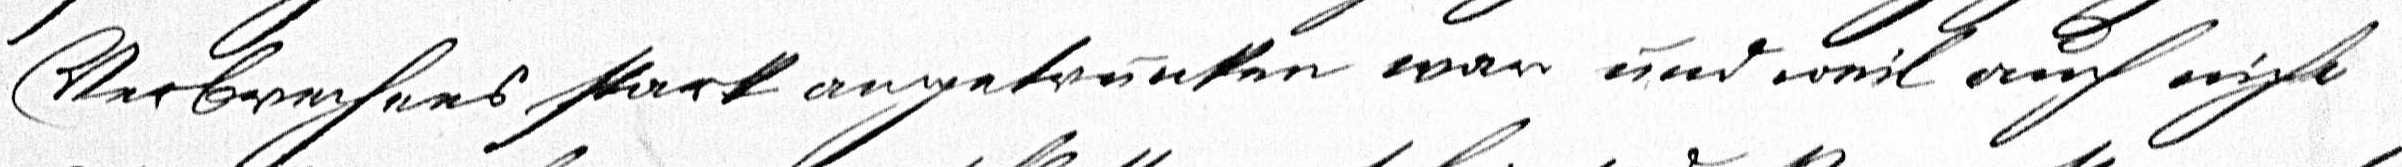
Verbrechens stark angetrunken war und weil auch nicht
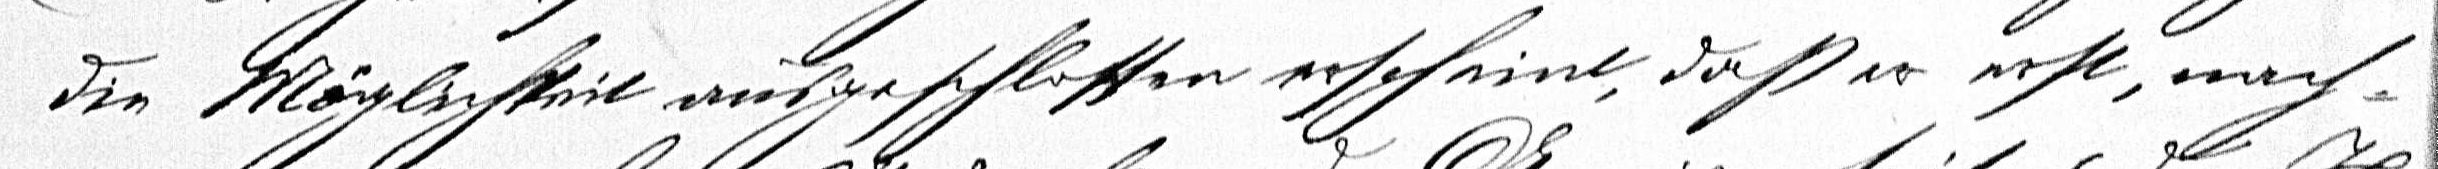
die Möglichkeit ausgeschlossen erscheint, daß er erst, nach¬
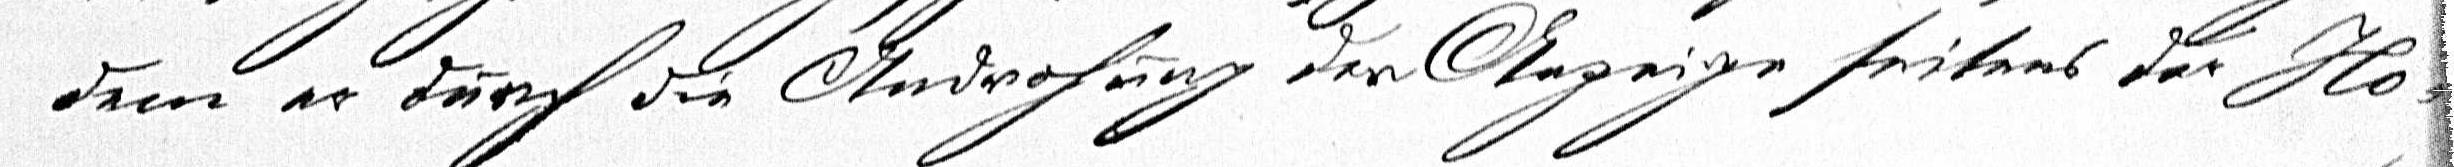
dem er durch die Androhung der Anzeige seitens der Ho¬
